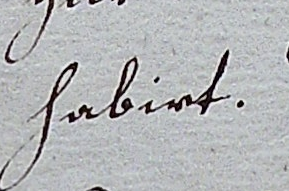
habirt.
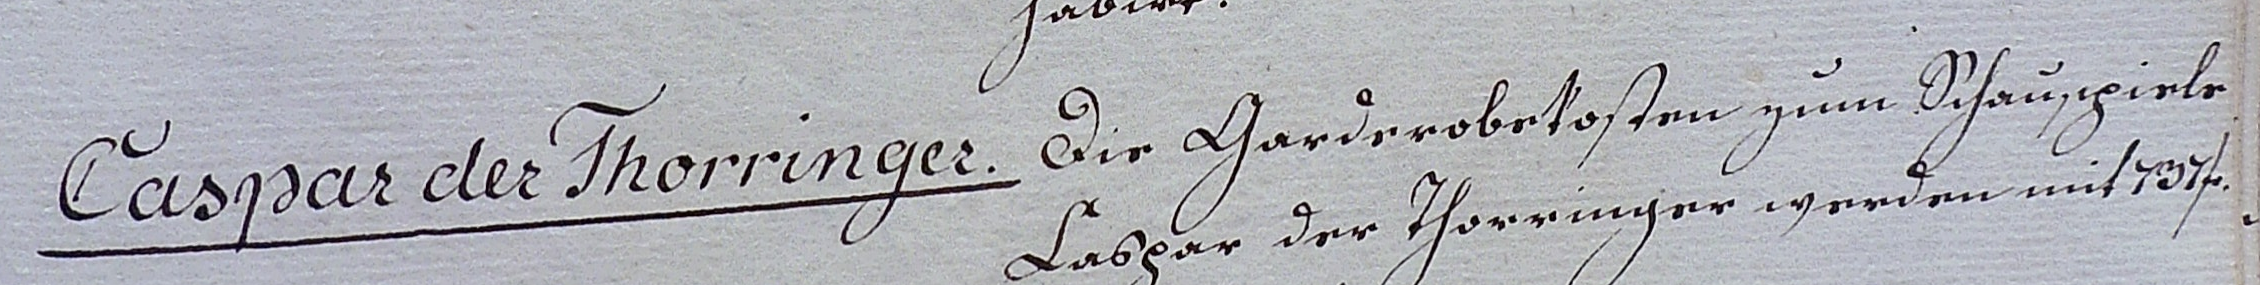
Caspar der Thorringer. Die Garderobekosten zum Schauspiele
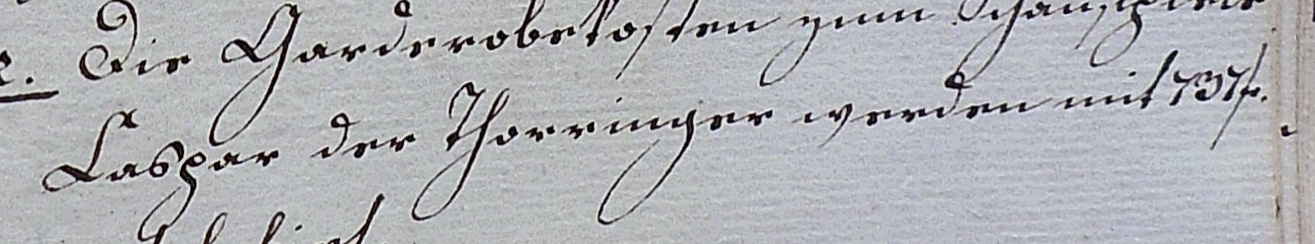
Caspar der Thorringer werden mit 737fr.
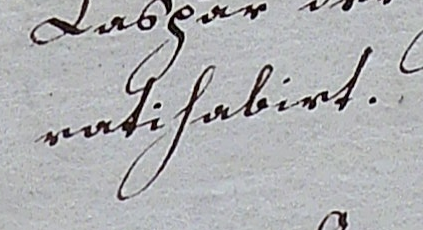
ratihabirt.
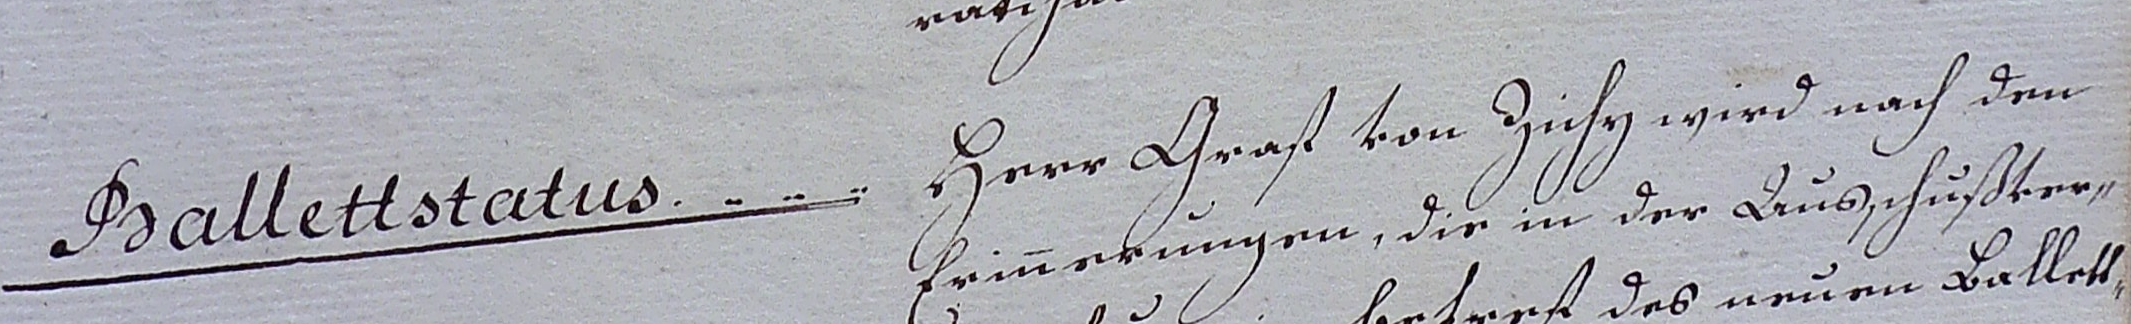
Ballettstatus. .. .. .. Herr Graf von Zichy wird nach den
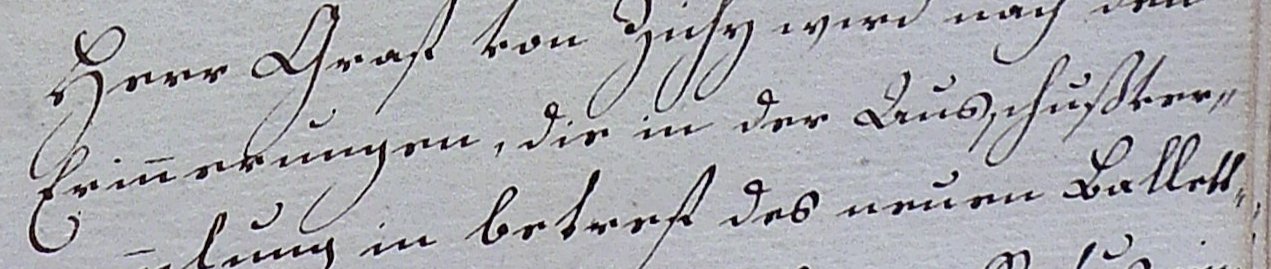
Erin̅erungen, die in der Ausschußver¬
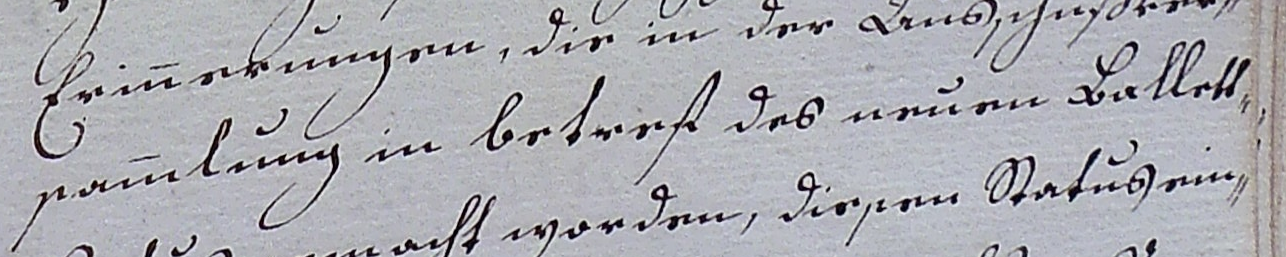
sam̅lung in betref des neuen Ballett¬
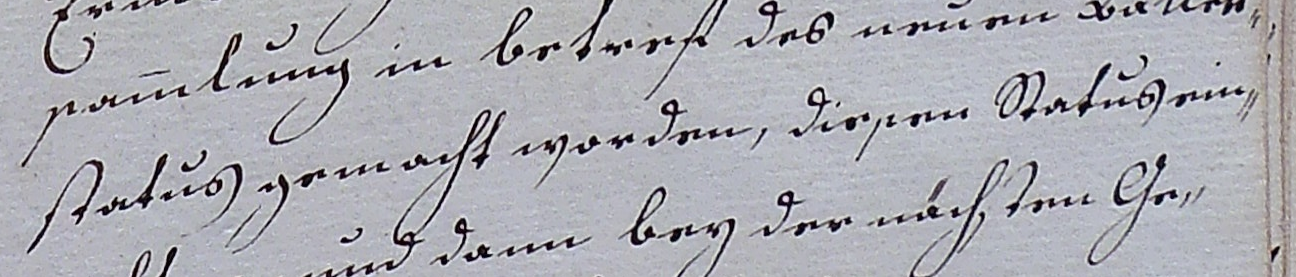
status gemacht worden, diesen Status ein¬
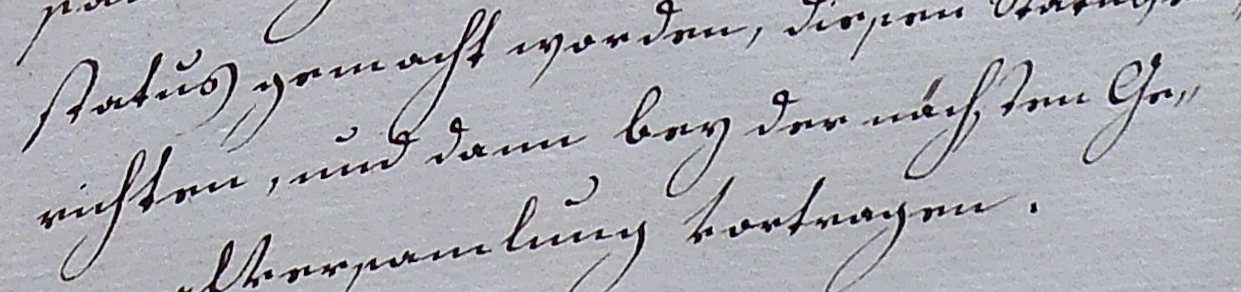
richten, und dann bey der nächsten Ge¬
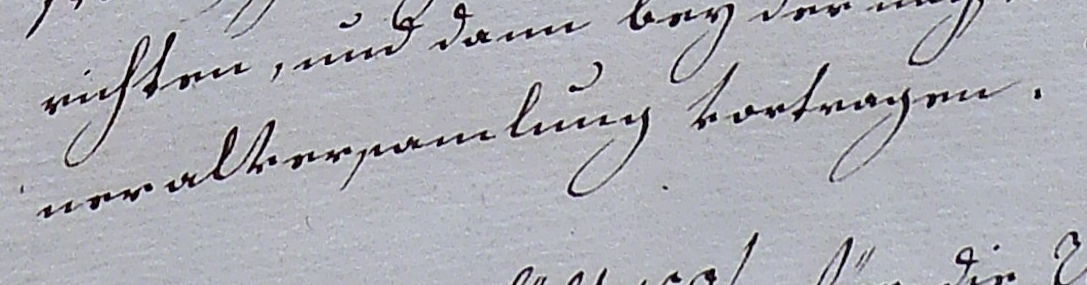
neralversamlung vortragen.
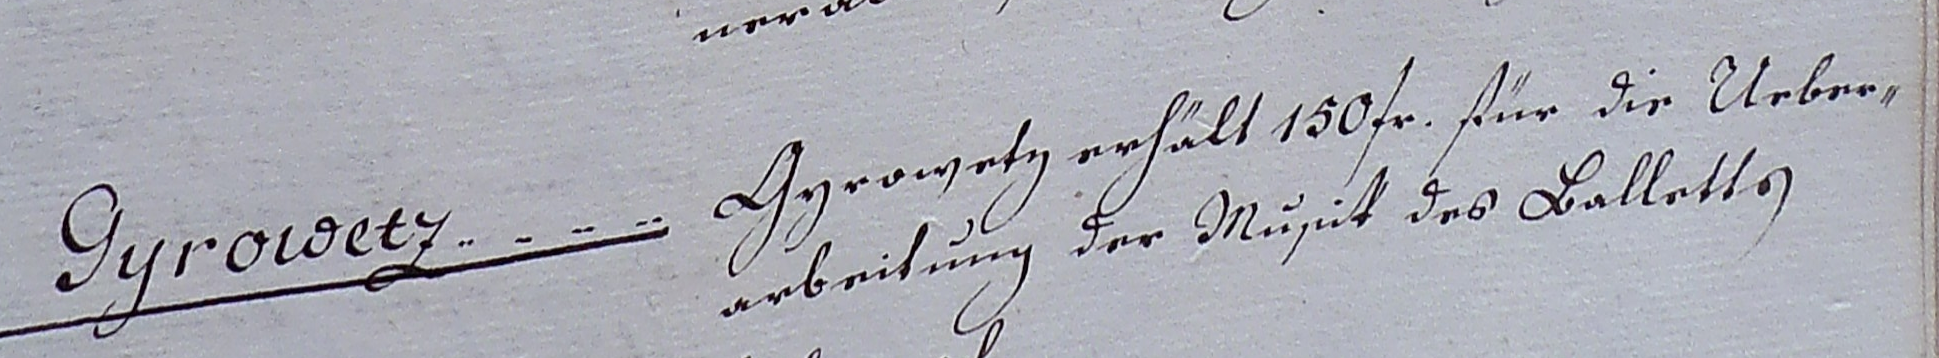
Gyrowetz .. .. .. Gyrowetz erhält 150fr. für die Ueber¬
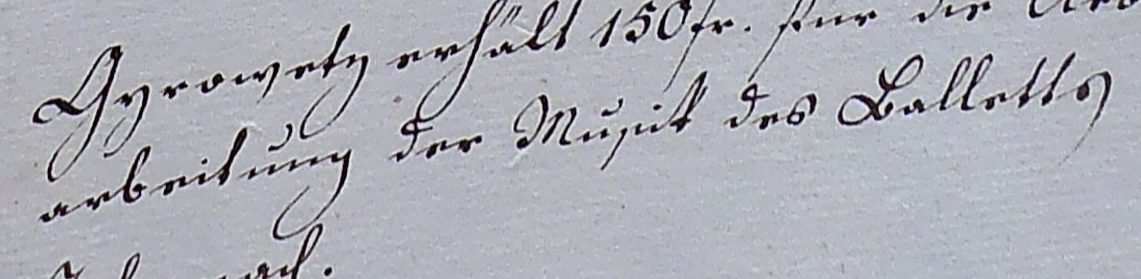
arbeitung der Musik des Balletts
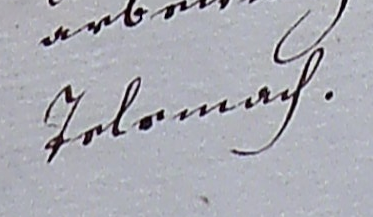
Telemach.
